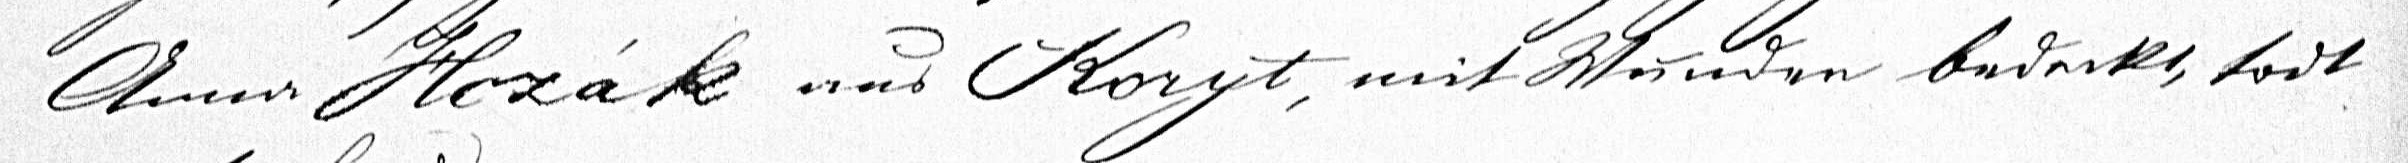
Anna Hozák aus Koryt, mit Wunden bedeck todt
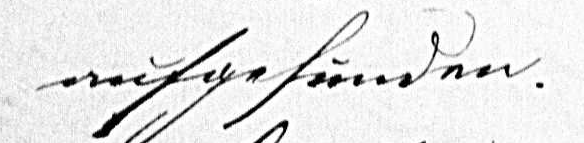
aufgefunden.
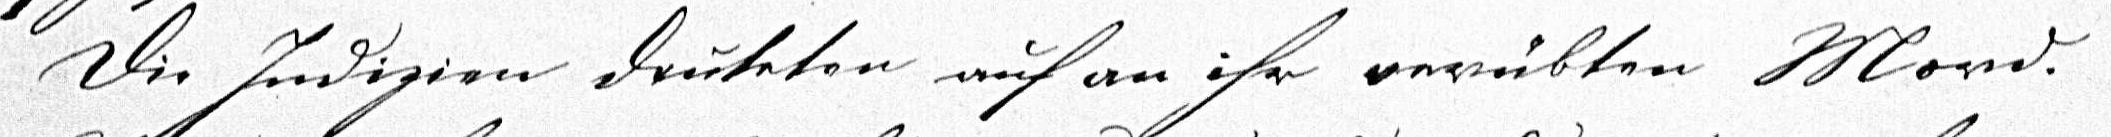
Die Indizien deuteten auf an ihr verübten Mord.
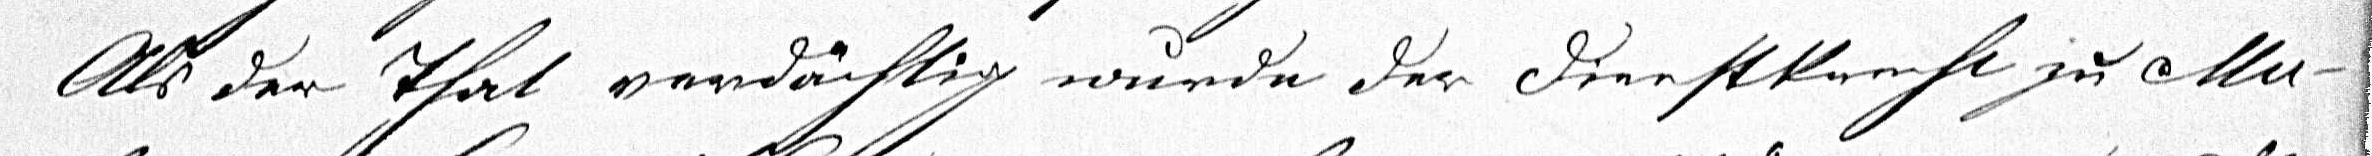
Als der That verdächtig wurde der Dienstknecht zu Mu¬
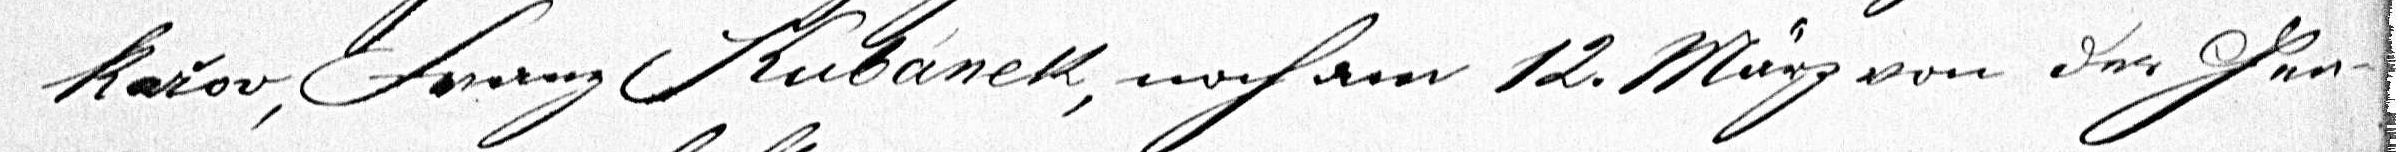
kařov, Franz Kubánek, noch am 12. März von der Gen¬
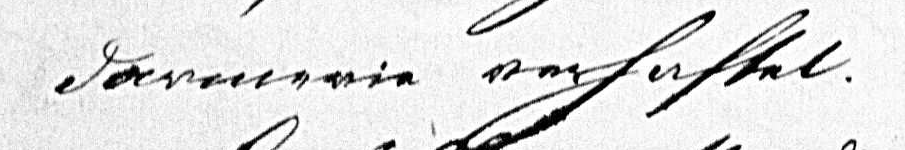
darmerie verhaftet.
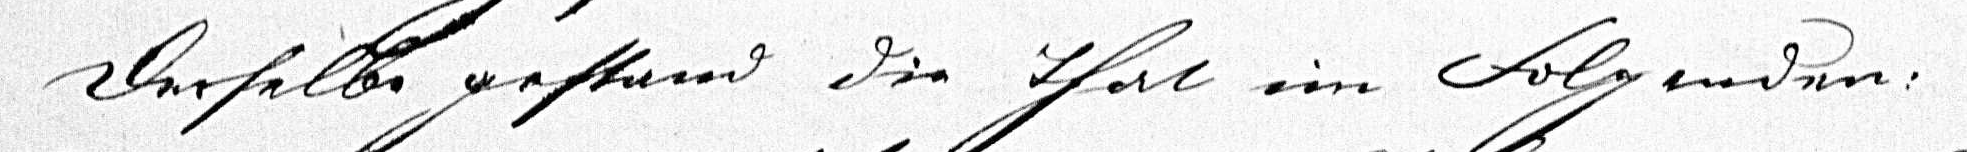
Derselbe gestand die That im Folgenden:
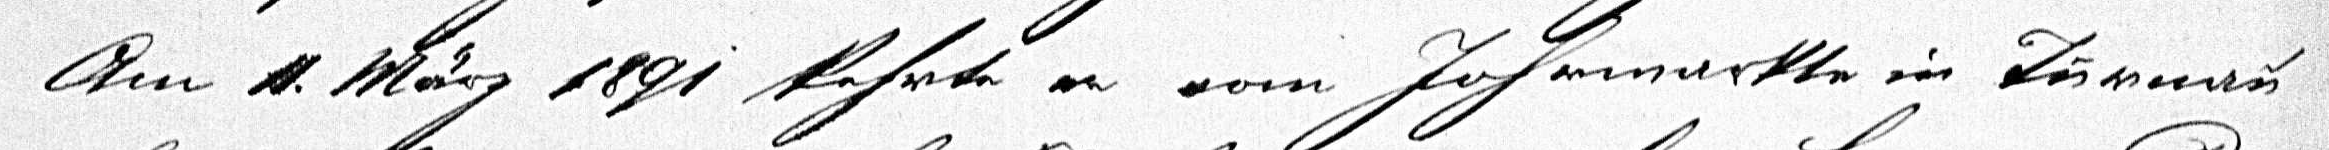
Am 11. März 1891 kehrte er von Jahrmarkte in Turnau
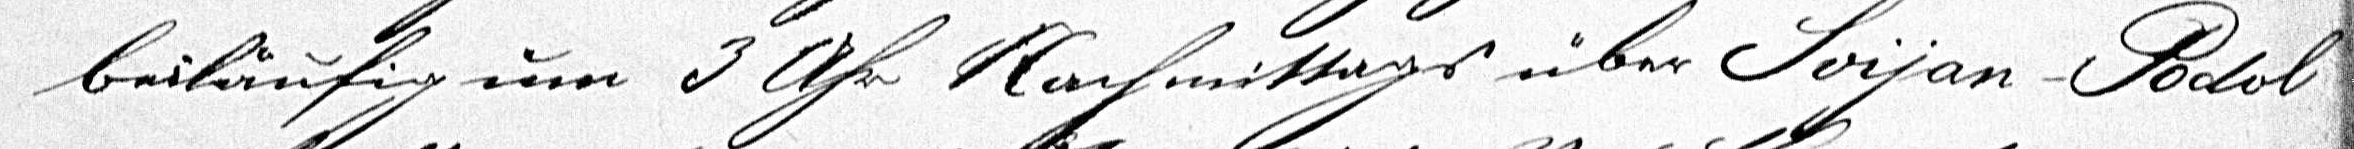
beiläufig um 3 Ihr Nachmittags über Svijan-Podol
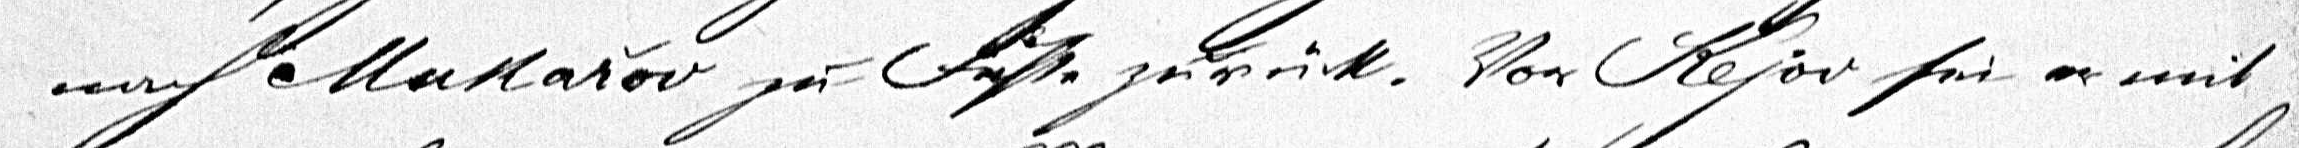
nach Mukařov zu Fuße zurück. Vor Kejov sei er mit
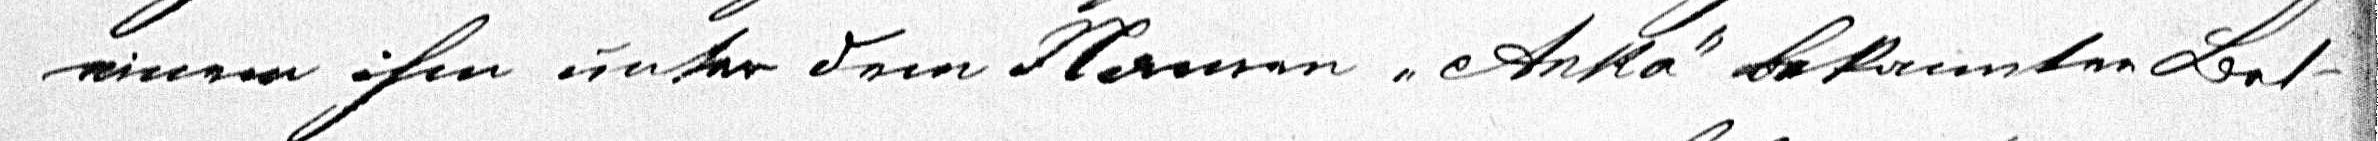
einer ihm unter dem Namen „Anka“ bekannten Bet¬
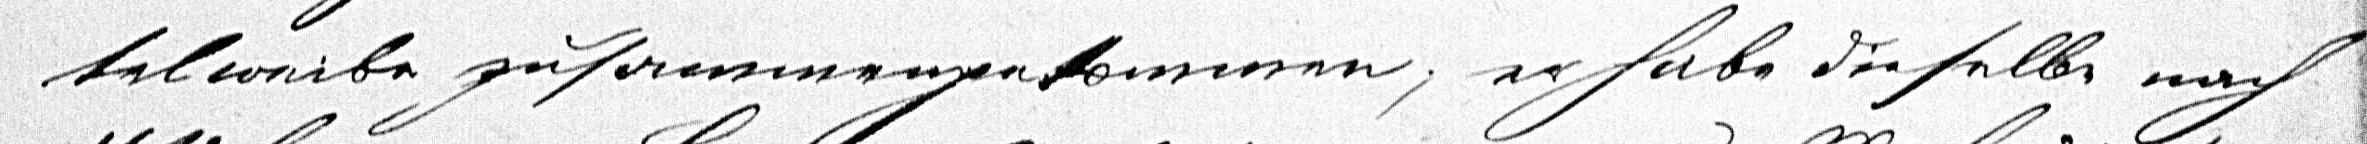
telweibe zusammengekommen, er habe dieselbe nach
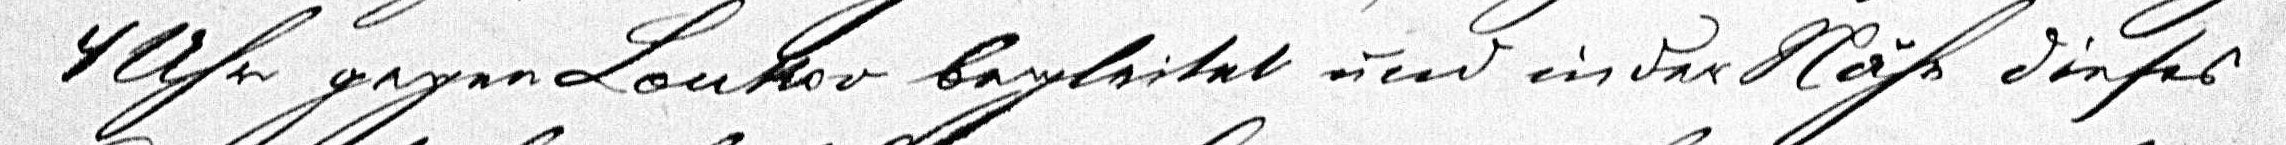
4 Uhr gegen Loukov begleitet und in der Nähe dieses
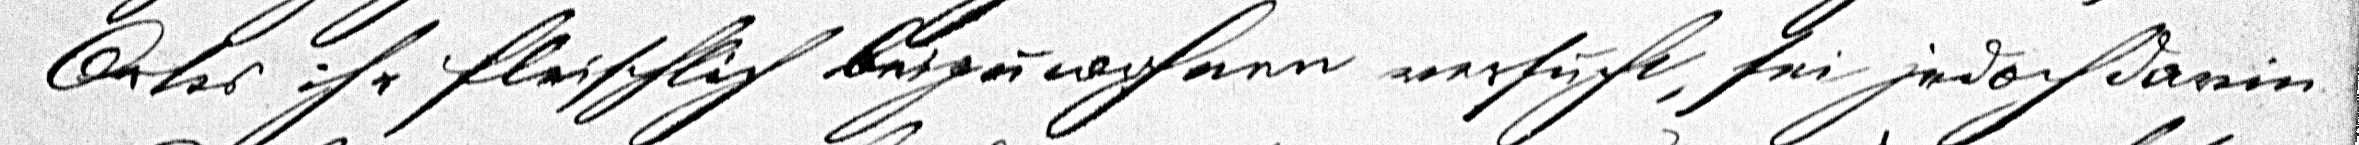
Ortes ihr fleischlich beizuwohnen versucht, sei jedoch darin
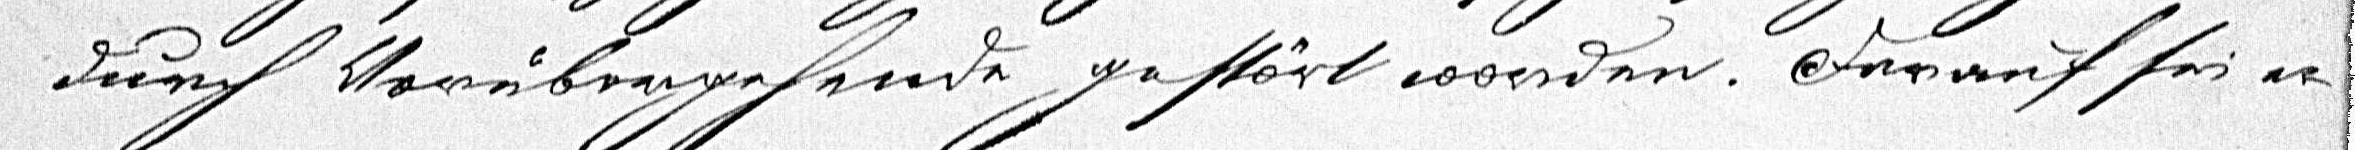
durch Vorübergehende gestört worden. Darauf sei er
